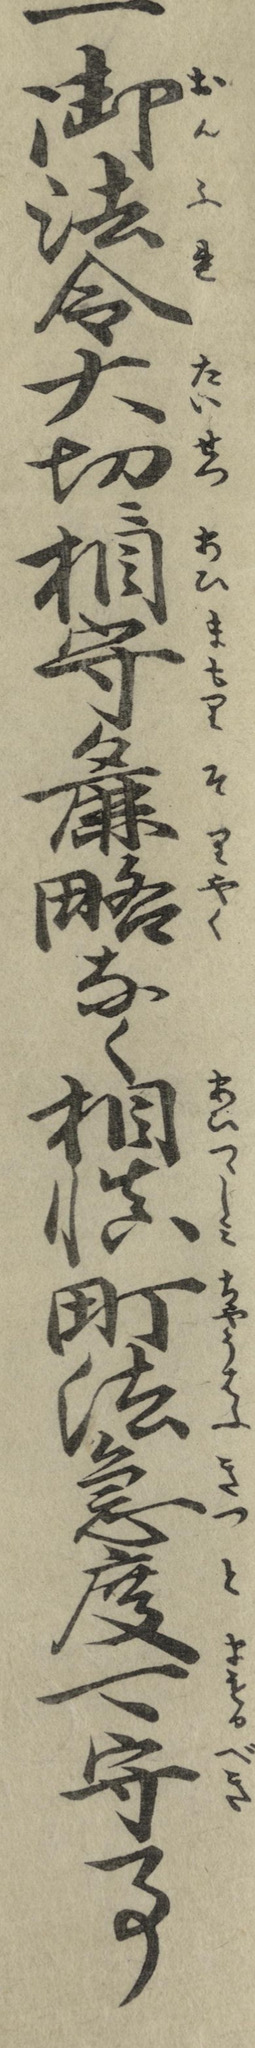一御法令大切に相守麁略なく相慎町法急度可守事
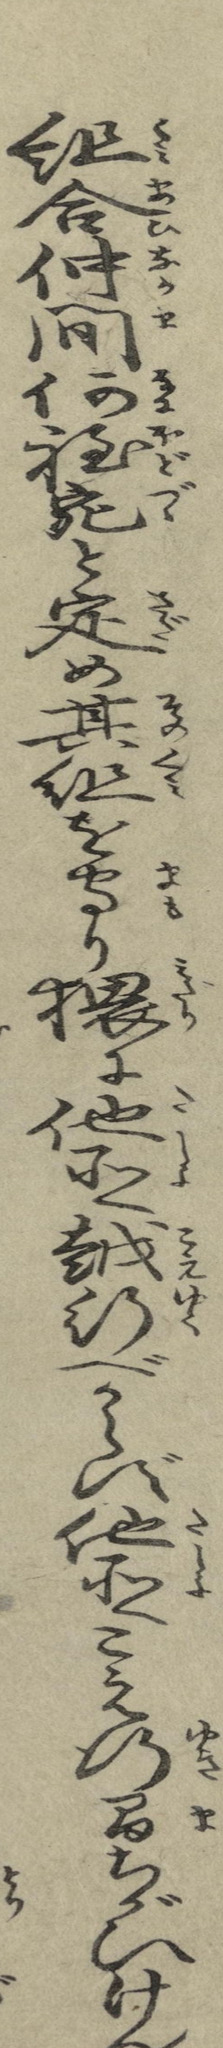組合仲間何程宛と定め其組を守り猥に他所へ越行べからず他所こえ行間ちがひけん
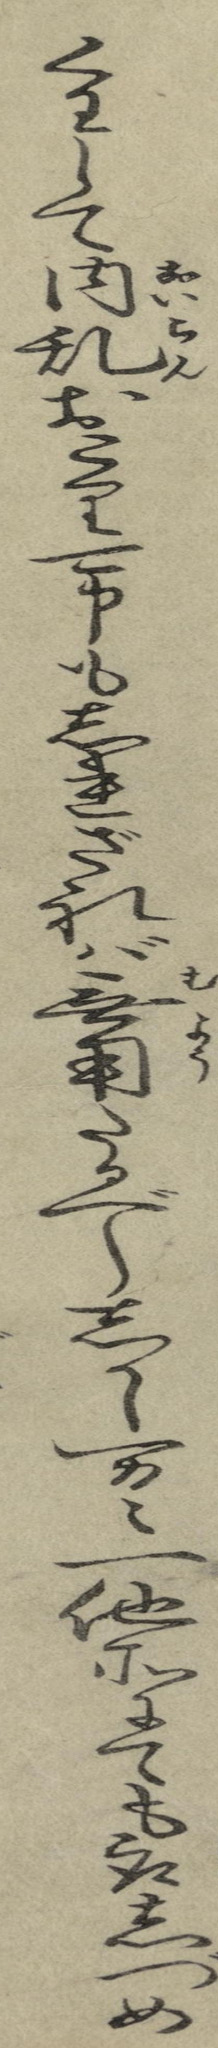くわして内乱おこり可申もしれざれば無用たるべししかし万〻一他所にても取しづめ
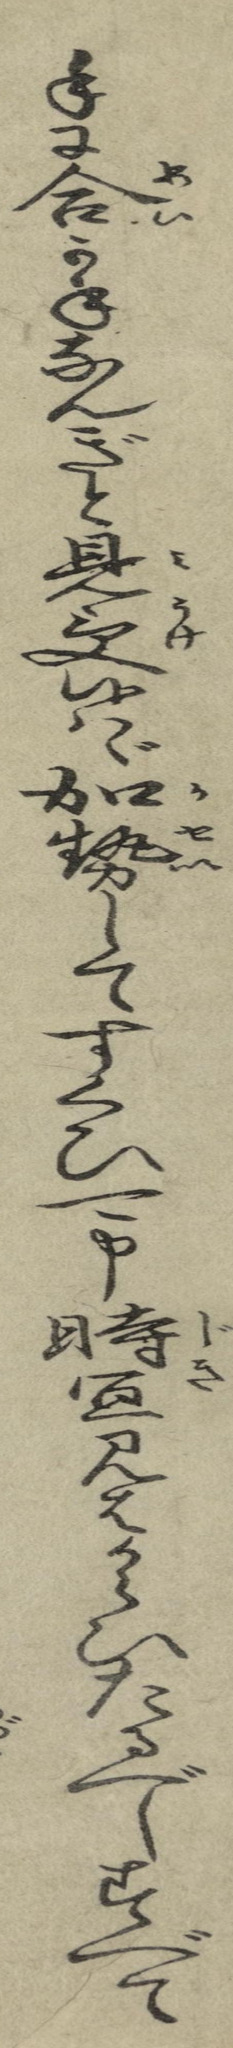手に合かねなんぎと見受候はゞ加勢してすくひ可申時宜見はからひたるべしすべて
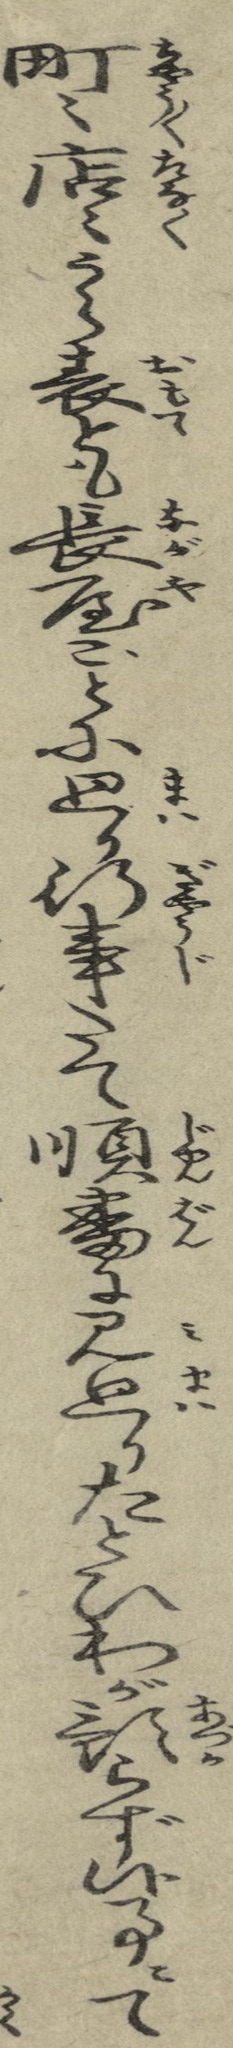町〻店〻うら表とも長屋ごとに廻り行事たて順番に見廻りたとひわが預らず候事にて
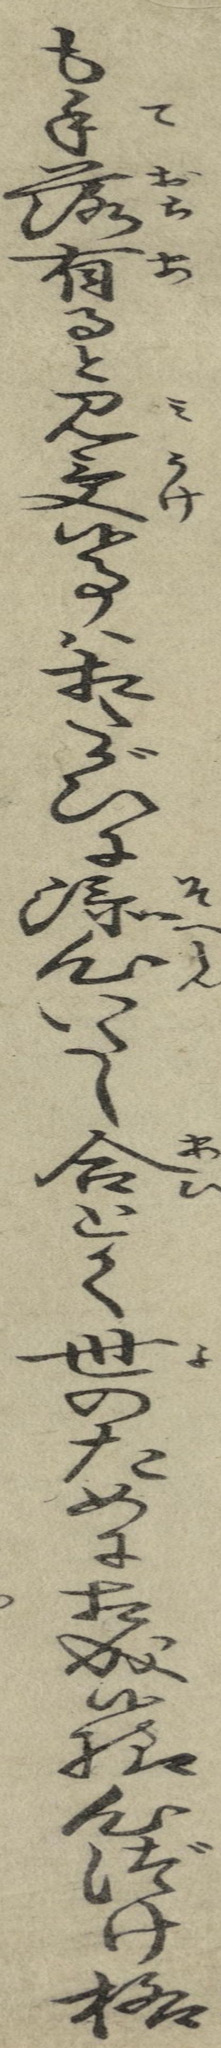も手落有ると見受候事は相たがひに添心いたし合とて世のために相成候様心づけ格
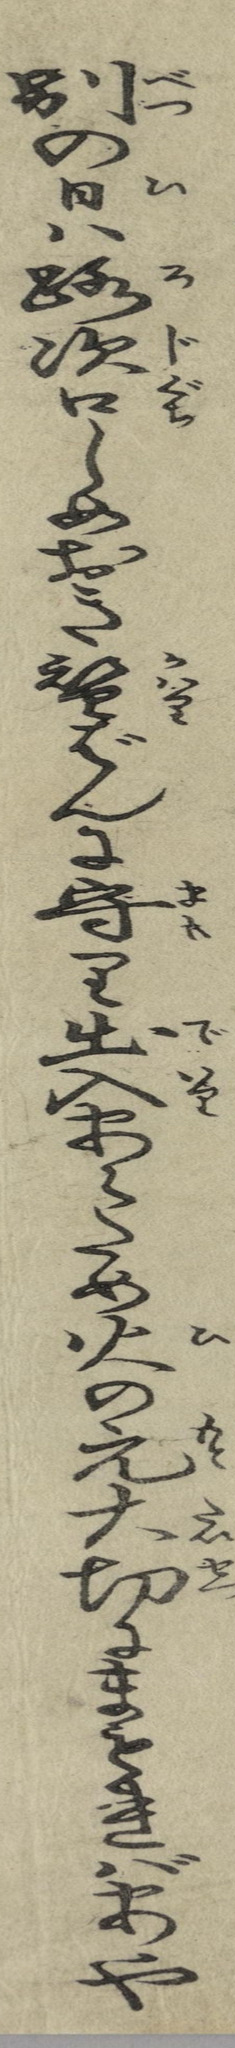別の日は路次口しめおき替ばんに守り出入あらため火の元大切にまもればあや
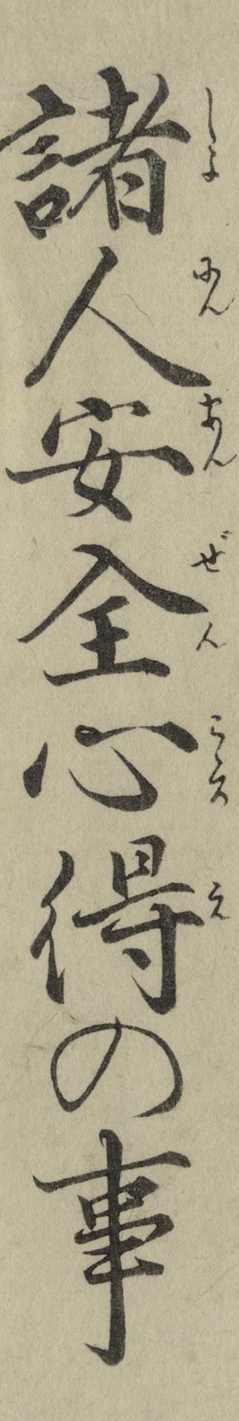諸人安全心得の事
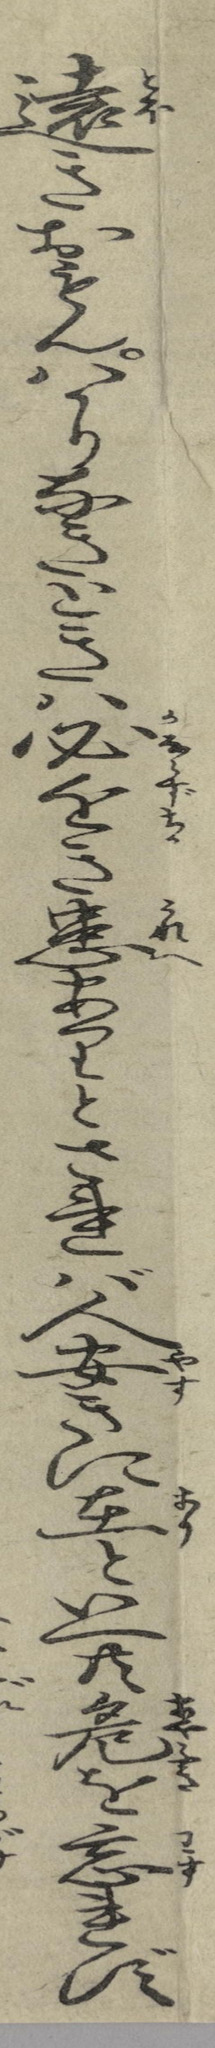遠きおもんぱかりなきときは必近き患ありとされば人安きに在といへ共危を忘れず
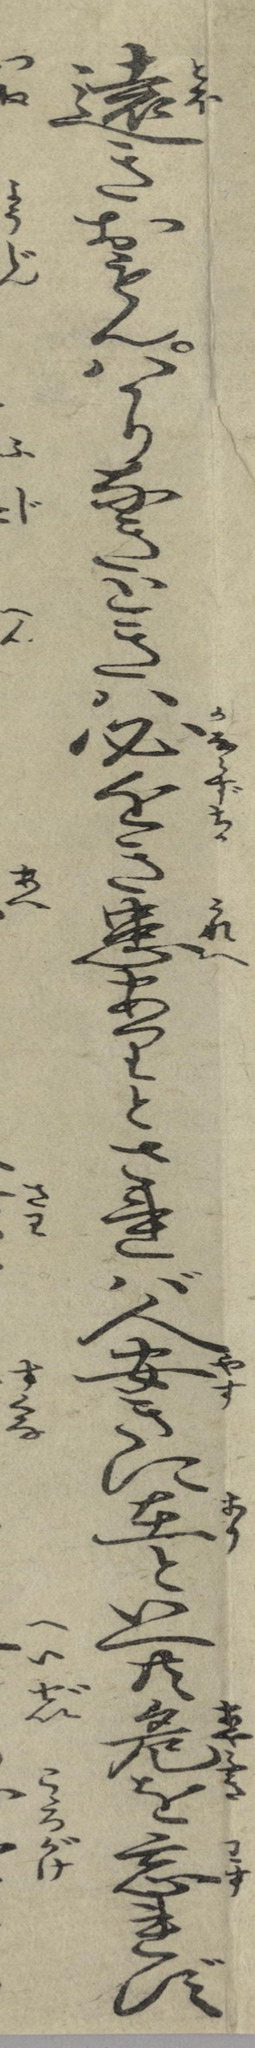遠きおもんぱかりなきときは必近き患ありとされば人安きに在といへ共危を忘れず
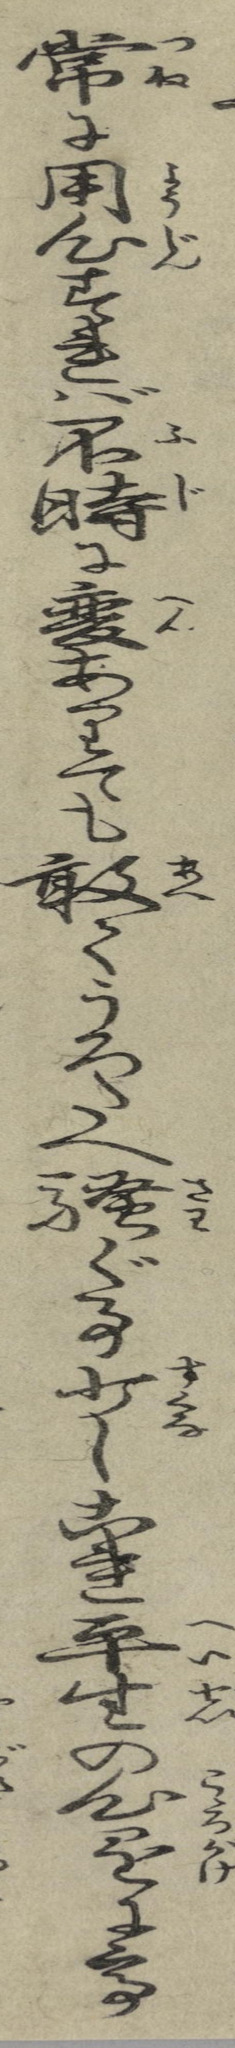常に用心すれば不時に変ありても敢てうろたへ騒ぐ事少しこれ平生の心懸に亭
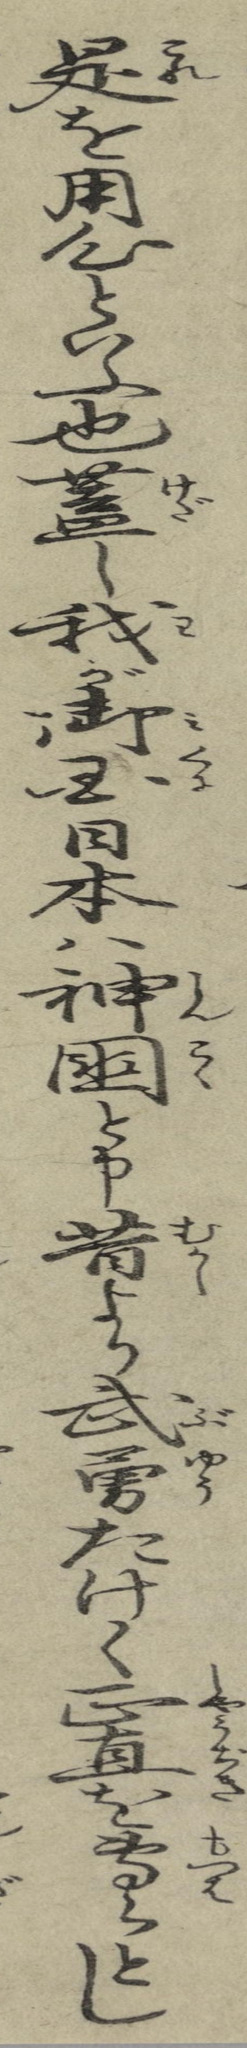是を用心といふ也蓋し我が御国日本は神国と申昔より武勇たけ〳〵正直を専らとし
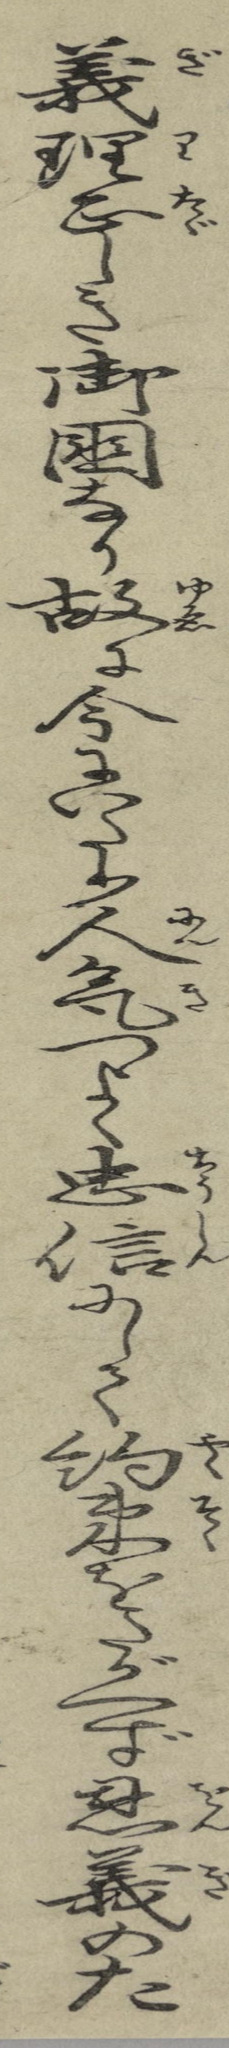義理正しき御国なり故に今にいたり人気つよく忠信にして約束をたがへず恩義のた
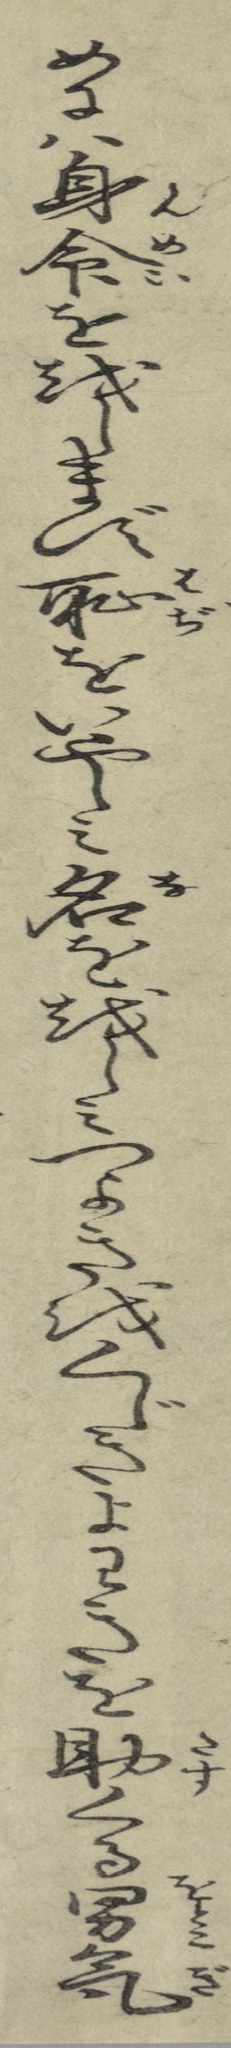めには身命ををしまず恥をいやしみ名ををしみつよきをくじきよわきを助くる男気
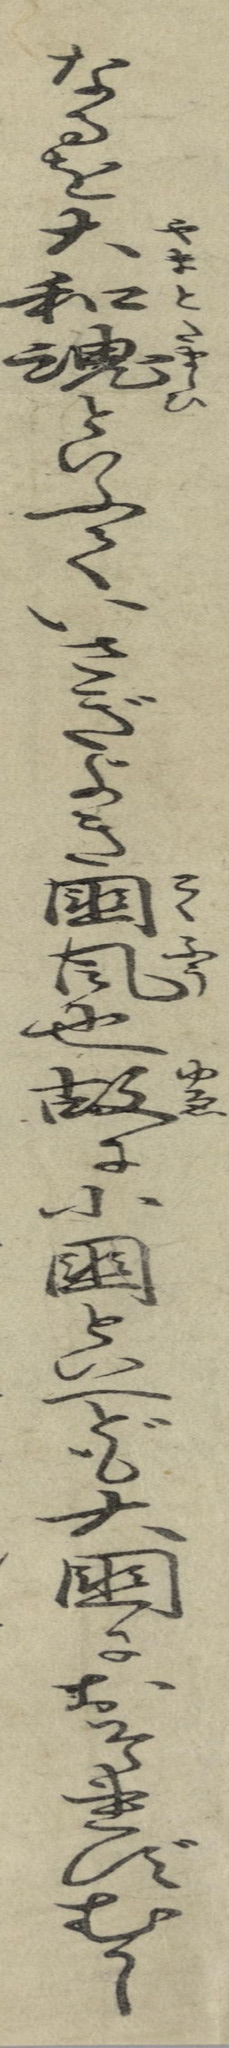なるを大和魂といふていさぎよき国風也故に小国といへども大国におそれずむかし
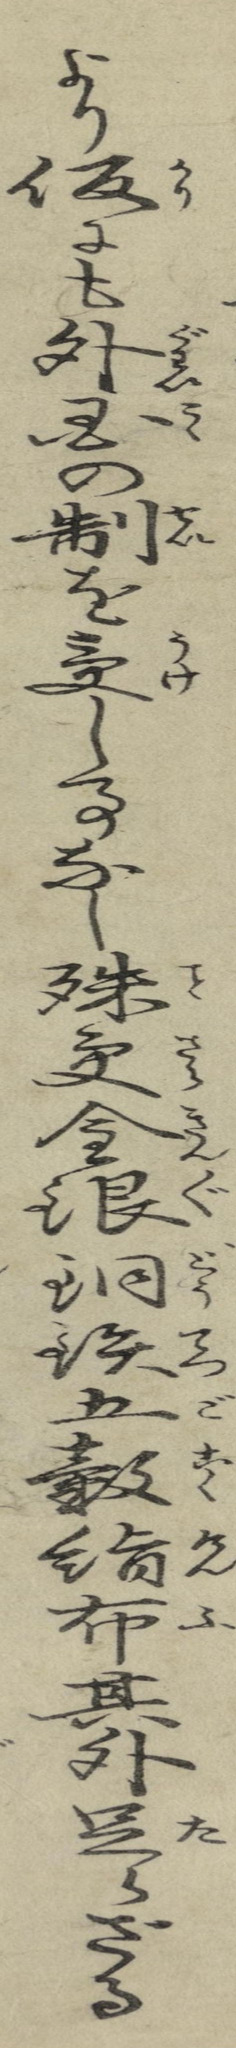より仮にも外国の制を受し事なし殊更金銀銅鉄五穀絹布其外足らざる
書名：火の元用心肝要之事・諸人安全心得の事
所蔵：東京大学地震研究所図書室 Earthquake Research Institute Library, The University of Tokyo, JAPAN
